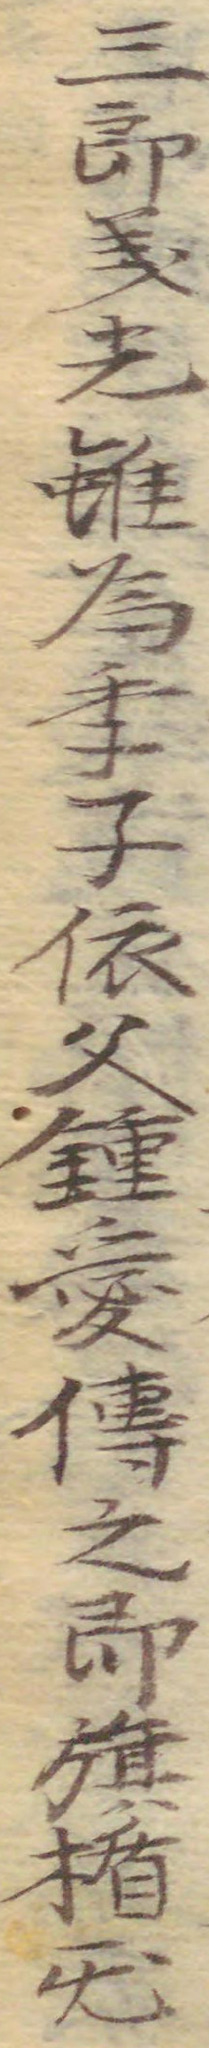三郎義光雖為季子依父鍾愛伝之即旗楯無

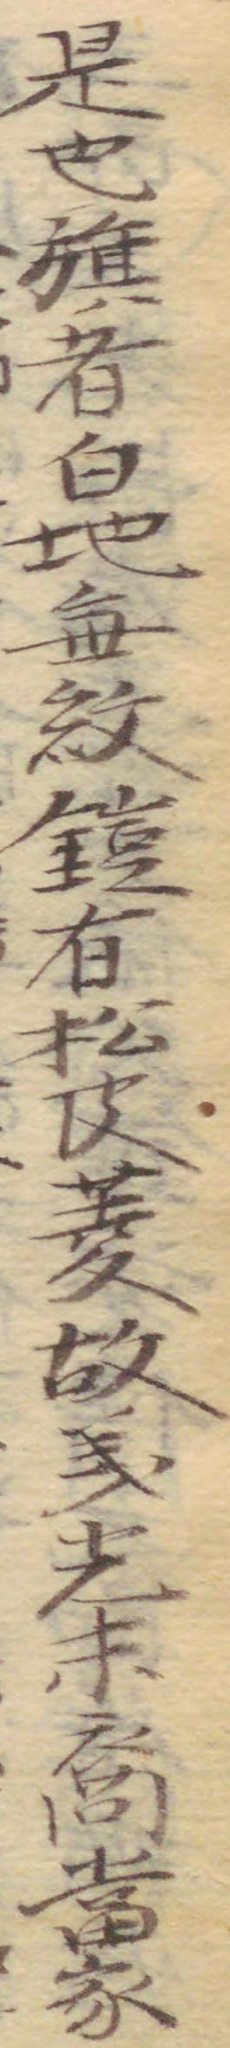是也旗者白知地無紋鎧有松皮菱故義光末裔当家
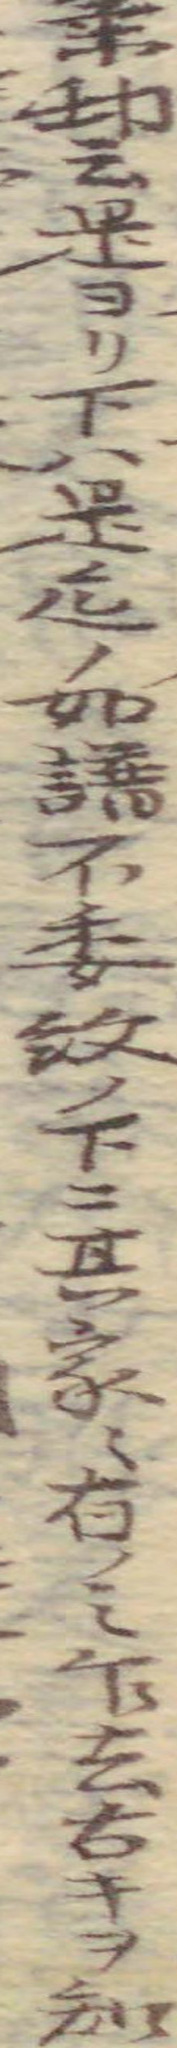乗頓云是ヨリ下ハ是迄ノ如譜不委紋ノ下ニ其家々有ノミ乍去古キヲ知ル
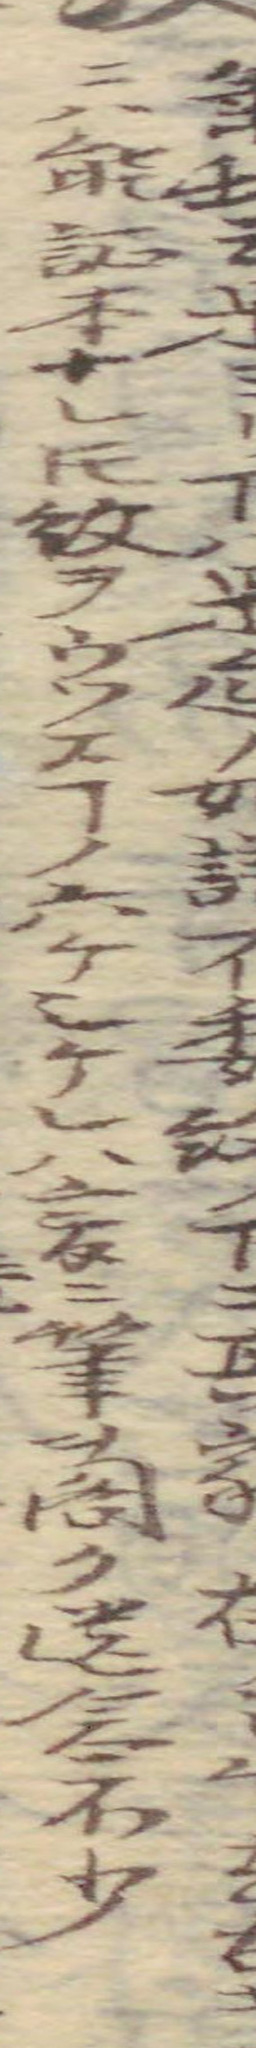ニハ能証本ナレトモ紋ヲウツスコトノ六ケシケレハ爰ニ筆ヲ閣ク遺念不少
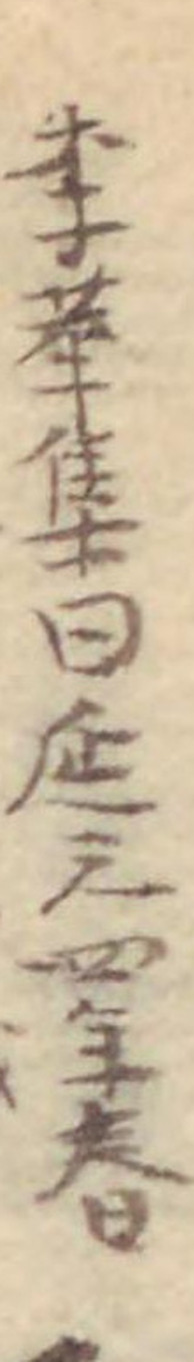李花集曰延元四年春
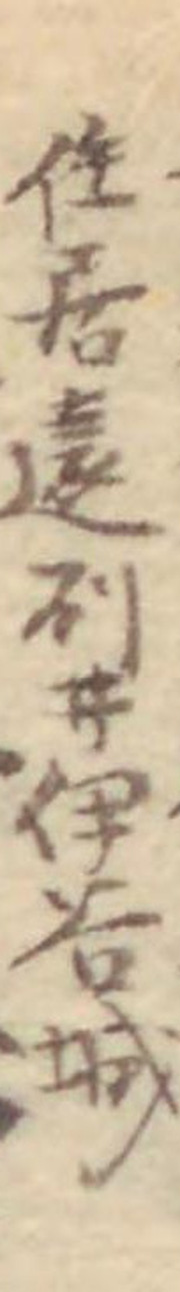住居遠州井伊谷城
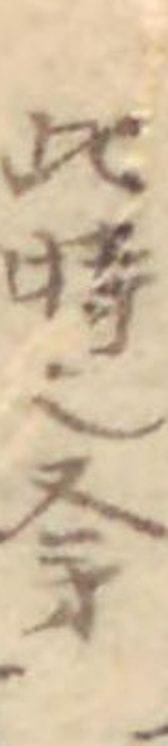此時也又第
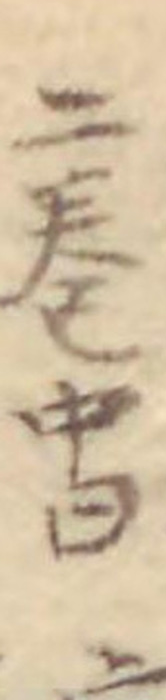ニ巻中曰
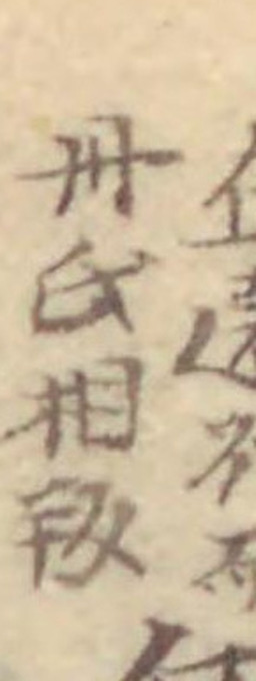丹氏相叛
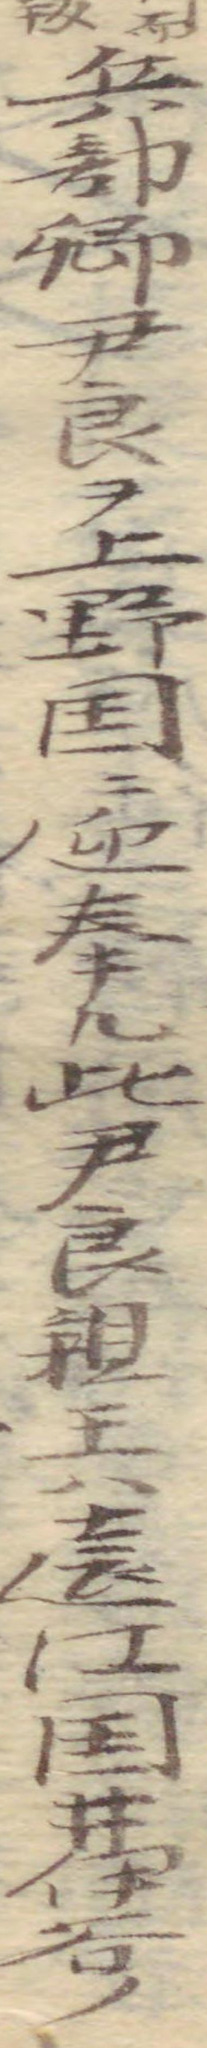兵部卿尹良ヲ上野国ニ迎奉ル此尹良親王ハ遠江国井伊谷ノ
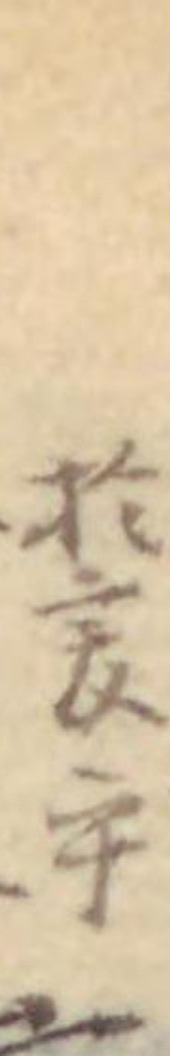於爰平
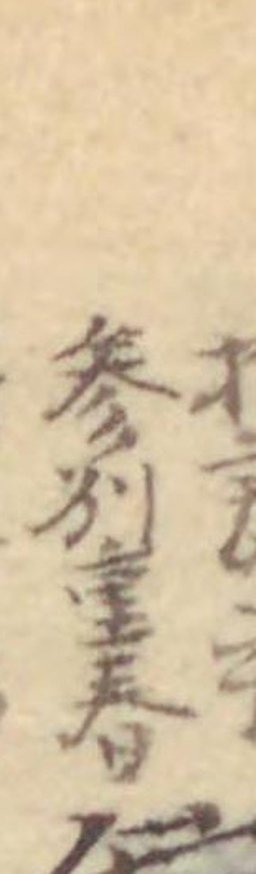参州重春
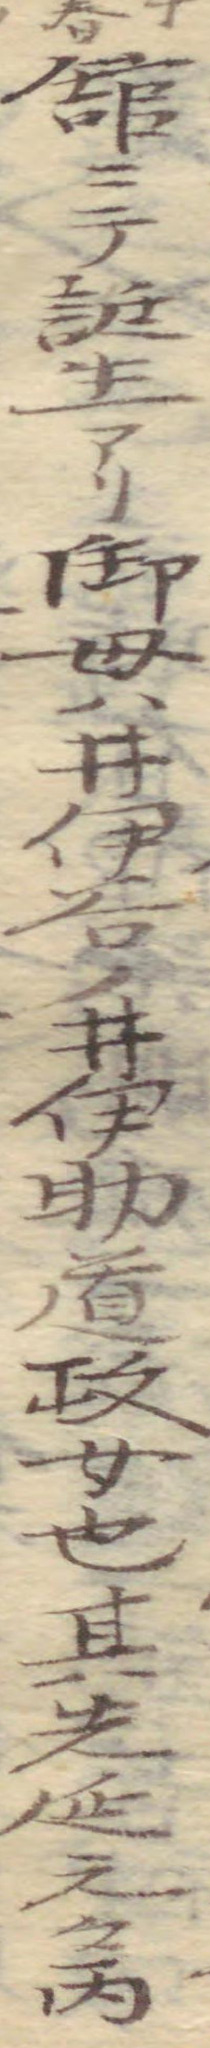館ニテ誕生アリ御母ハ井伊谷ノ井伊助道通政女也其先延元々丙
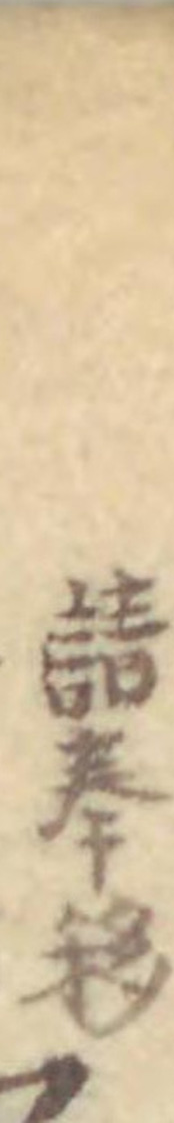請奉移
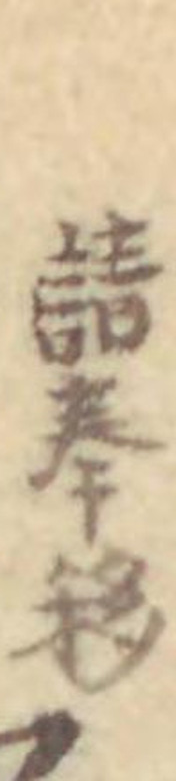請奉移
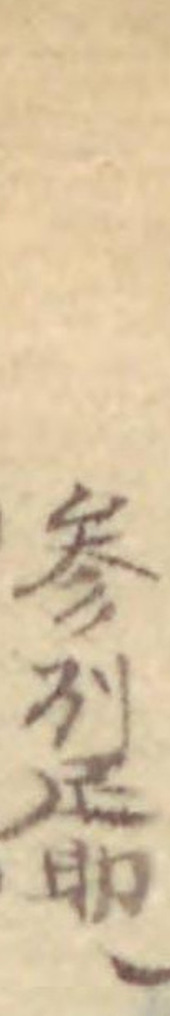参州足助
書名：鶯宿雑記. 巻199-200
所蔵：国立国会図書館 National Diet Library, JAPAN
